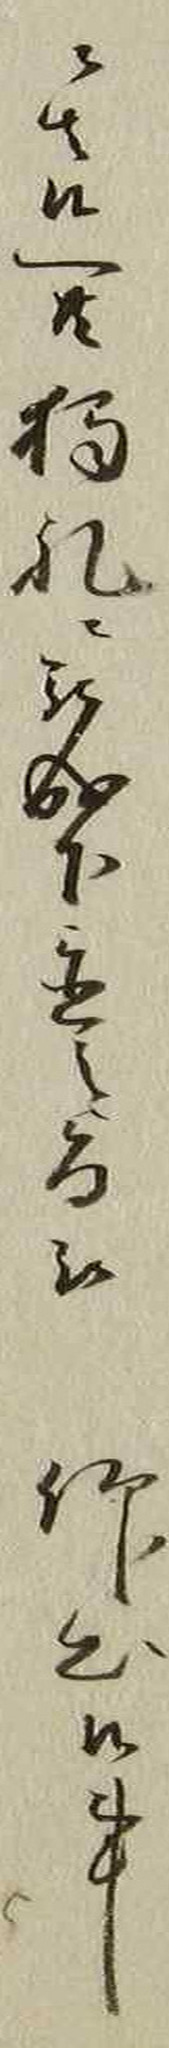ニ者候へ共独礼ニ被成下置之旨被仰出候事
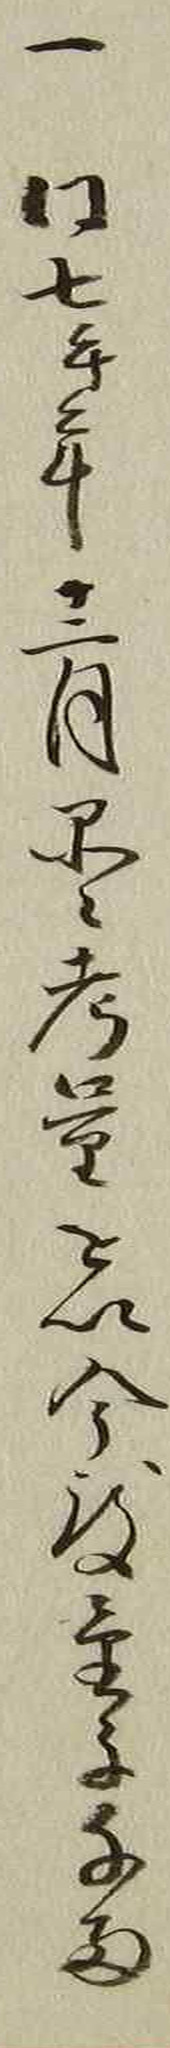一同七午年十二月品々考量を以今度金子千両
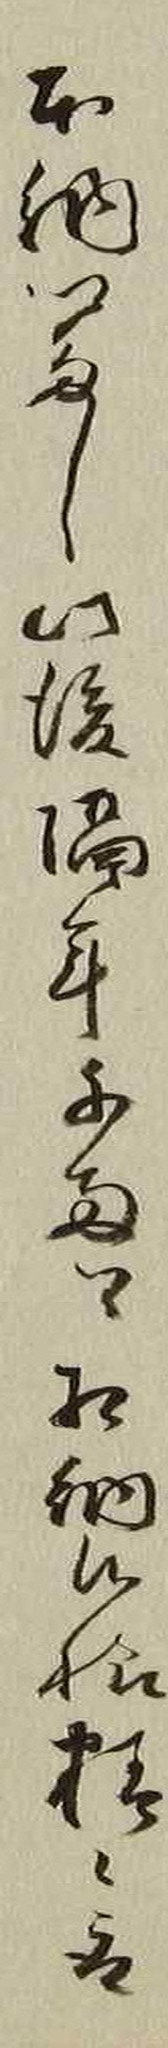本納いたし此後隔年千両つゝ相納候様精々取
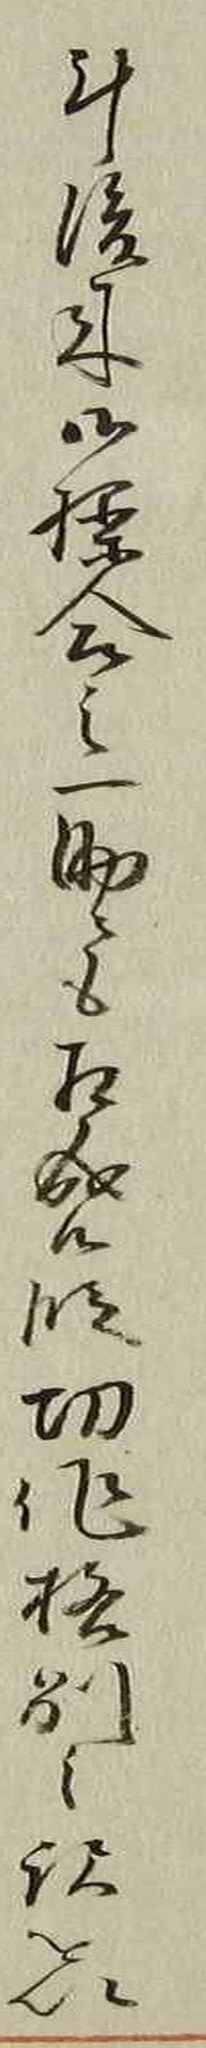計後来御繰合之一助ニも相成候段功作格別之訳を以
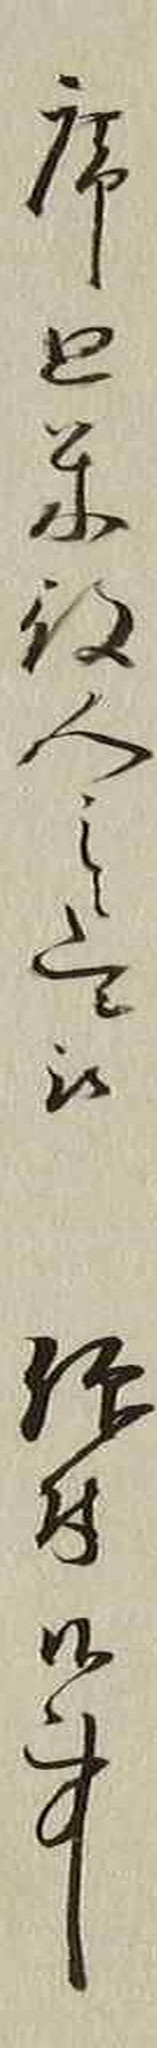席廻米役人之上ニ被仰付候事
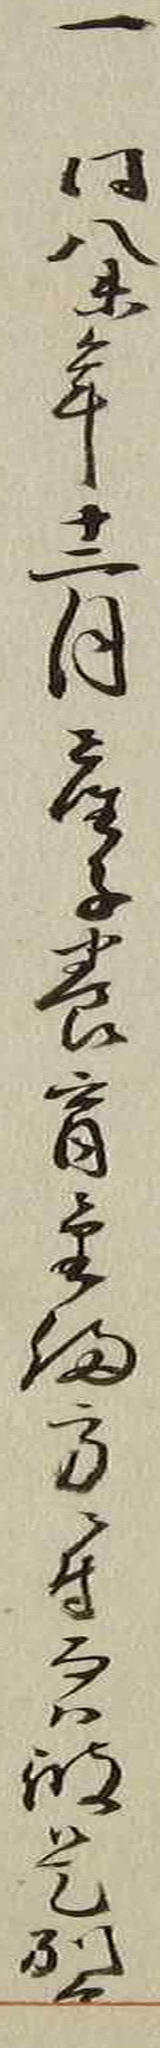一同八未年十二月産子養育金備方ニ付而は彼是別而
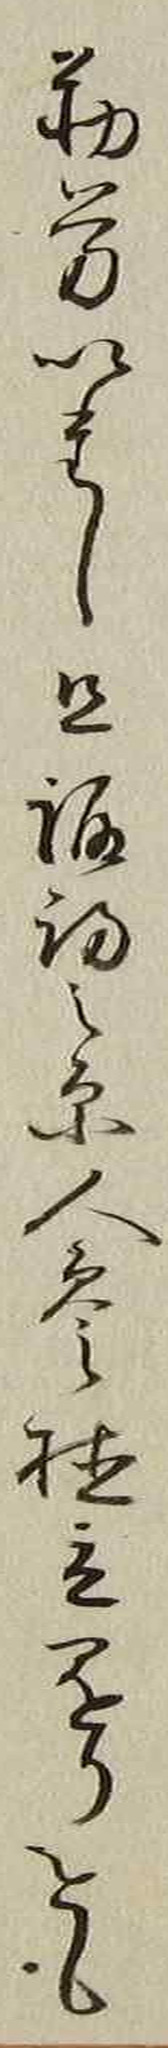勤労いたし且之糸人参植立懸りをも
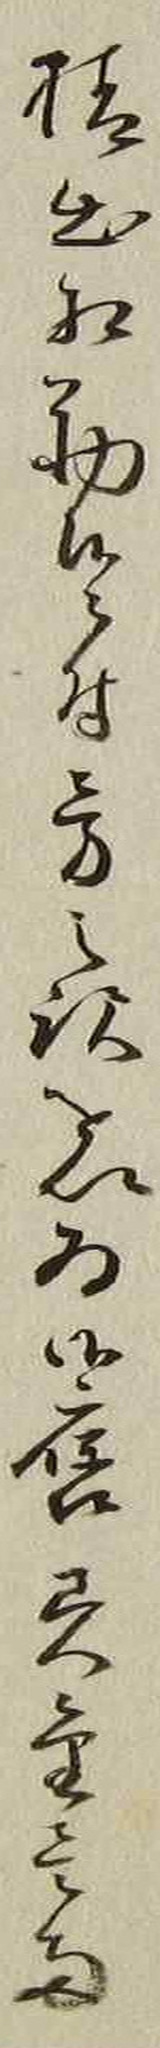精出相勤候ニ付旁之訳を以為御褒美金壱両
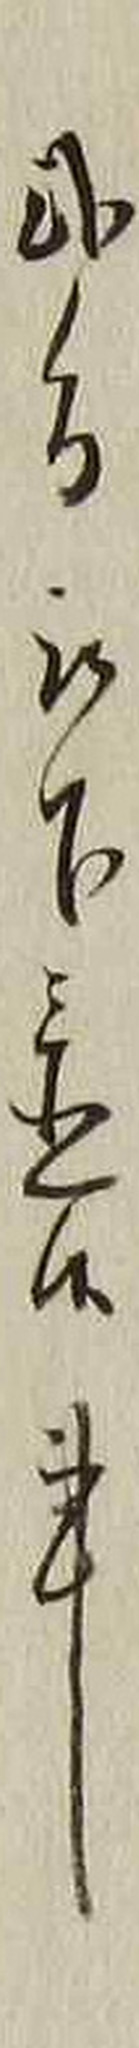弐分被下置候事
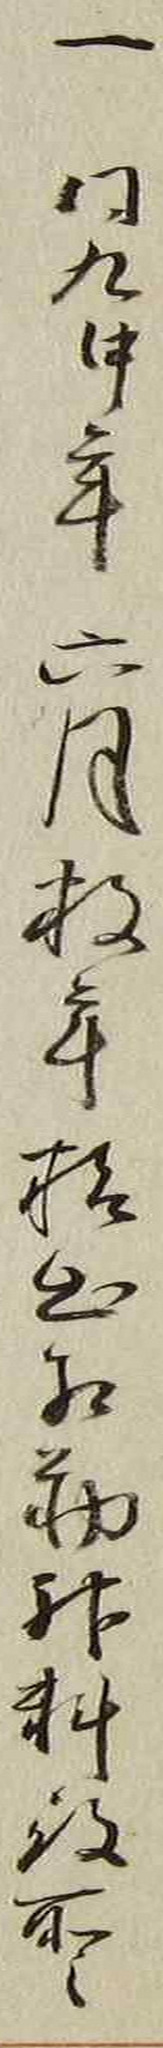一同九申年六月数年精出相勤神料役所之
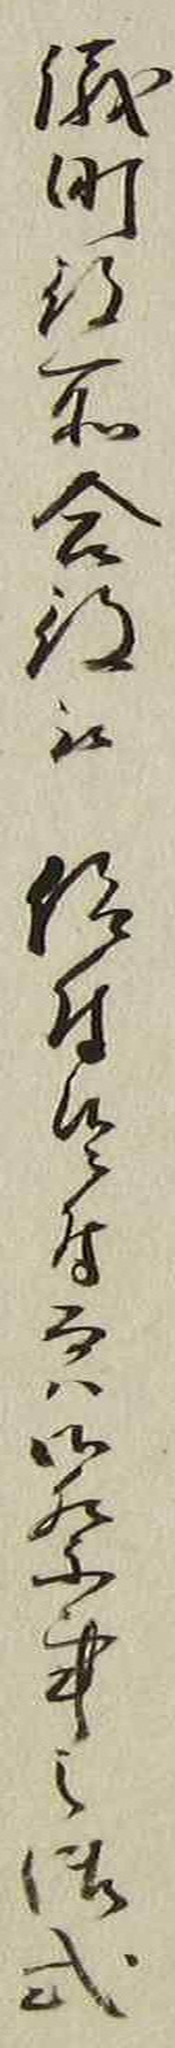儀町役所合役被仰付候ニ付而は御祭事之御式
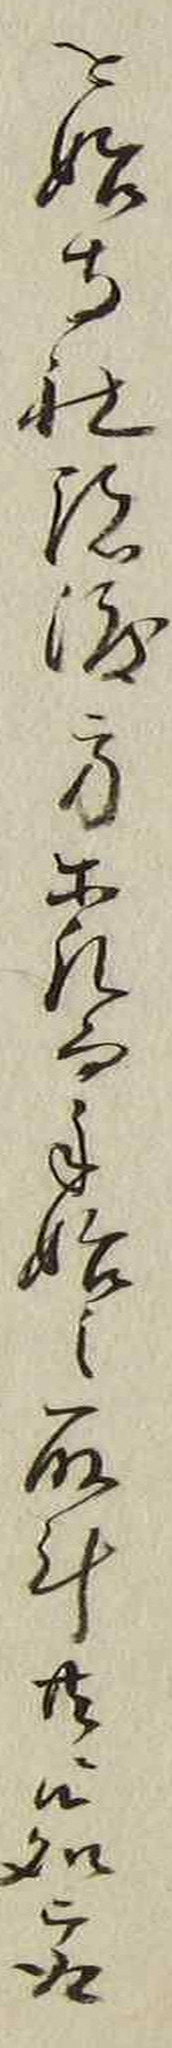を始寺社諸渡方等凡而手始之取計共々候処被取
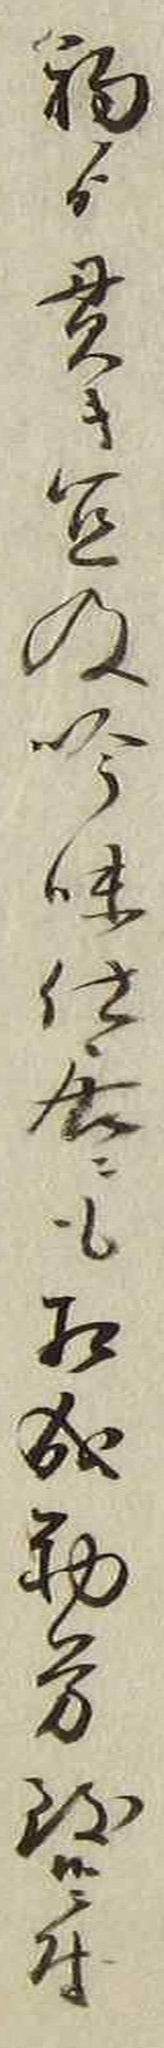初ゟ貫き宜及吟味仕居ニも相成勤労致候ニ付

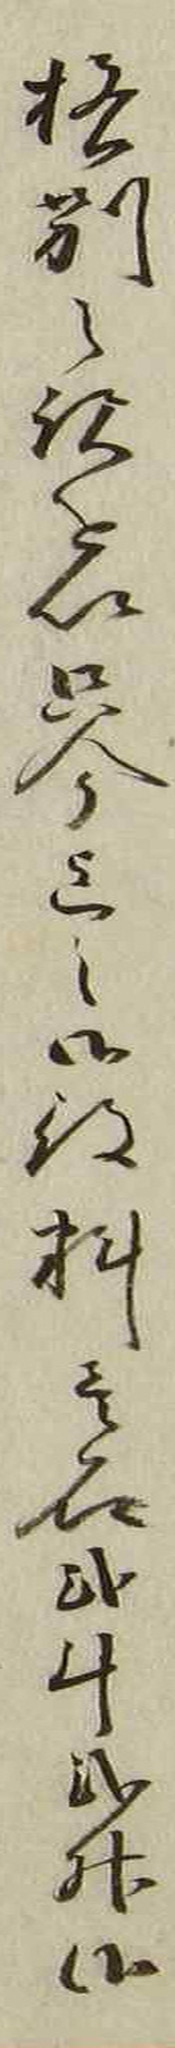格別之訳を以只今迄之御役料壱石弐斗弐升御
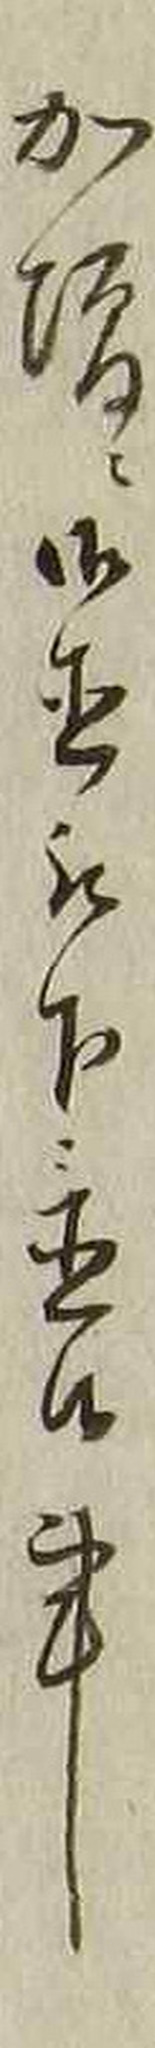加増ニ御直被下置候事
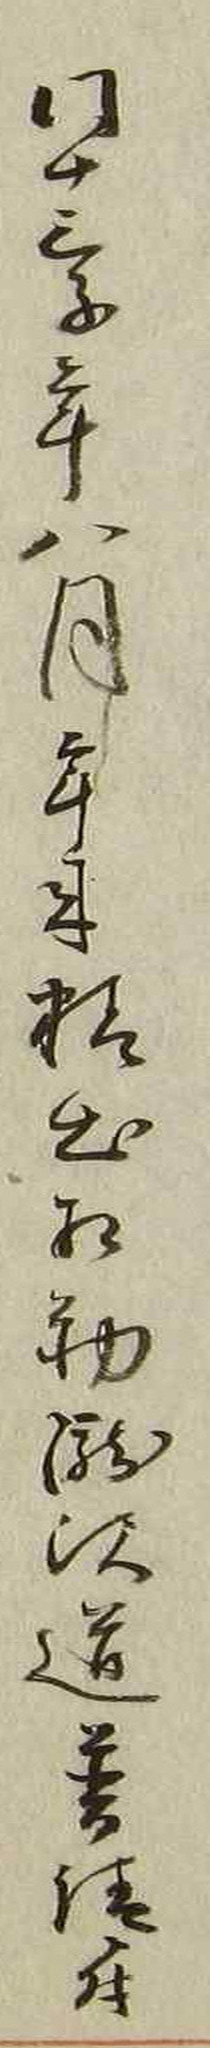一同十三子年八月年来精出相勤滝次道普請ニ付
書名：諸士系譜　巻之32　い之部32
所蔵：会津若松市立会津図書館
